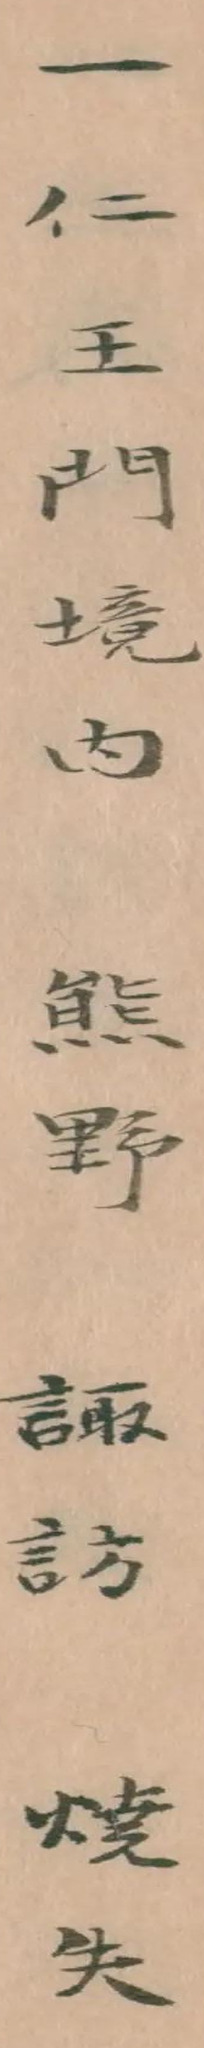一仁王門境内熊野諏訪焼失
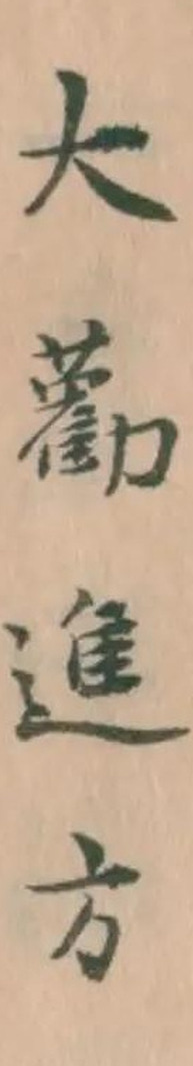大勧進方
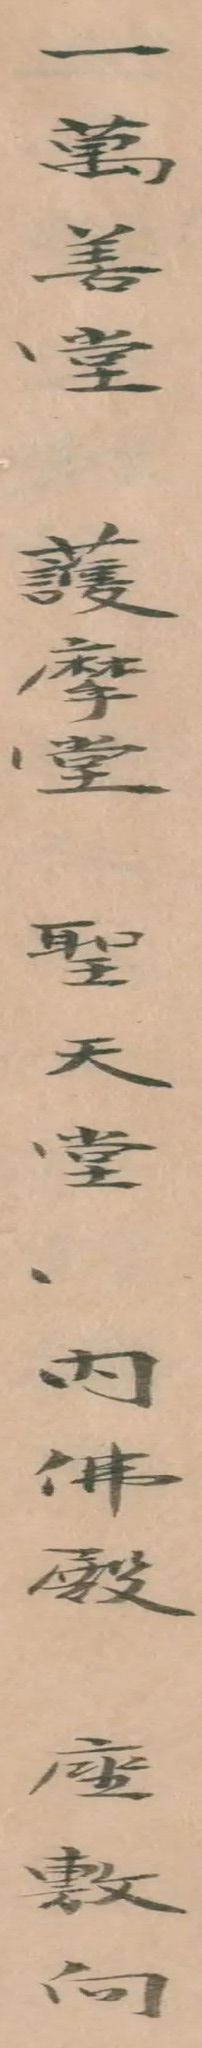一万善堂護摩堂聖天堂内仏殿座敷向

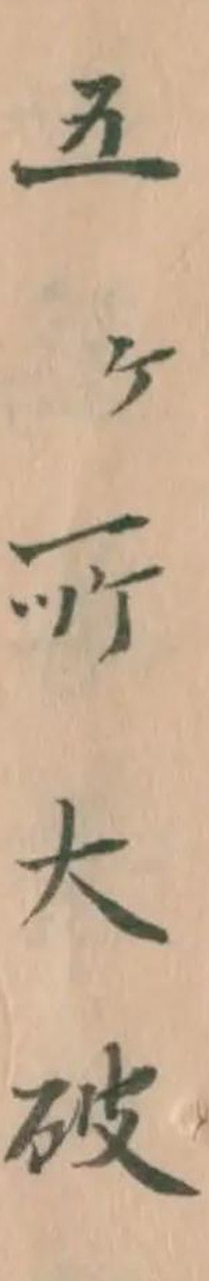五ヶ所大破
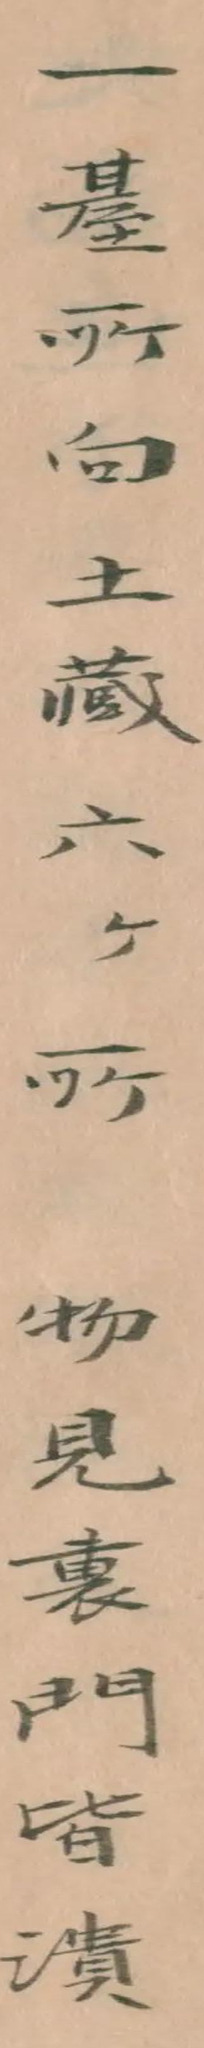一台所向土藏六ケ所物見裏門皆潰
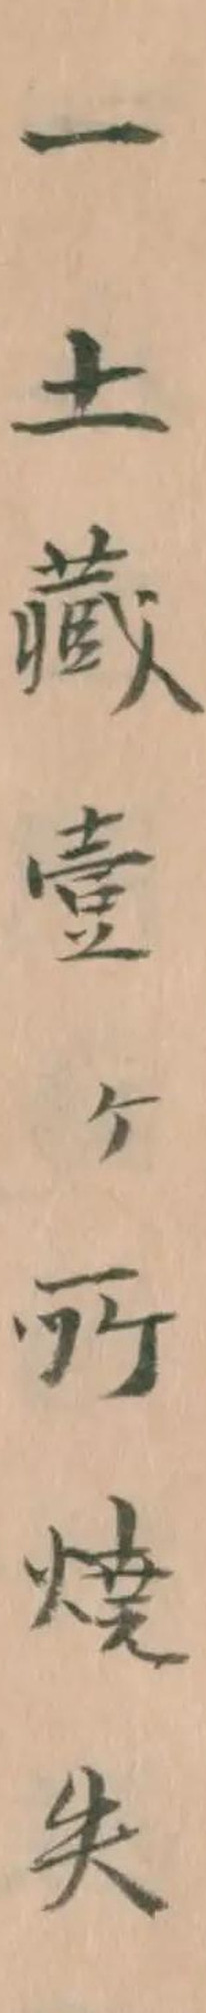一土藏壹ケ所焼失
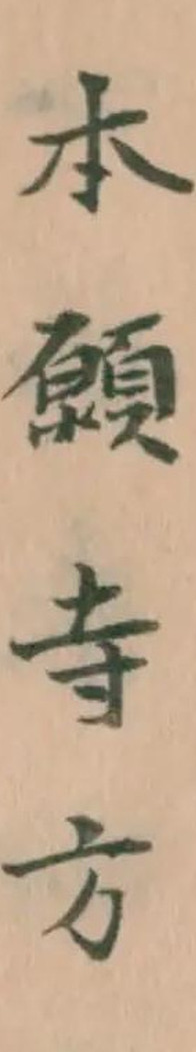本願寺方
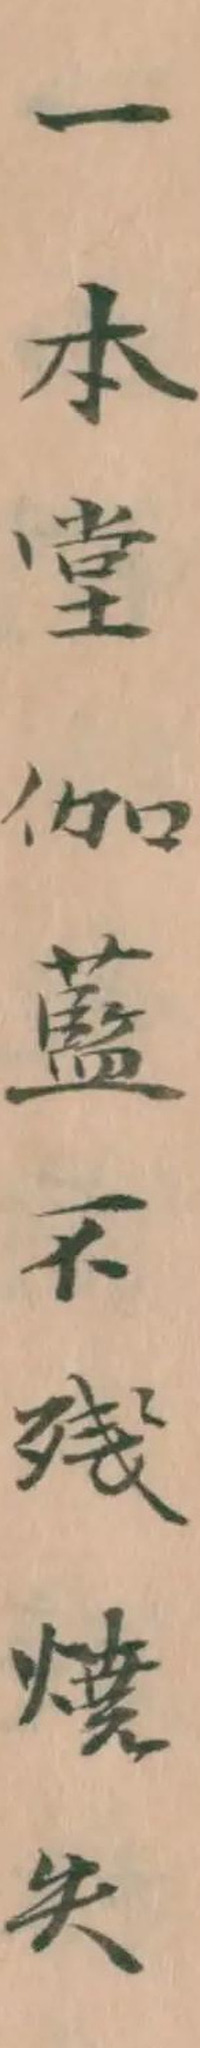一本堂伽藍不残焼失
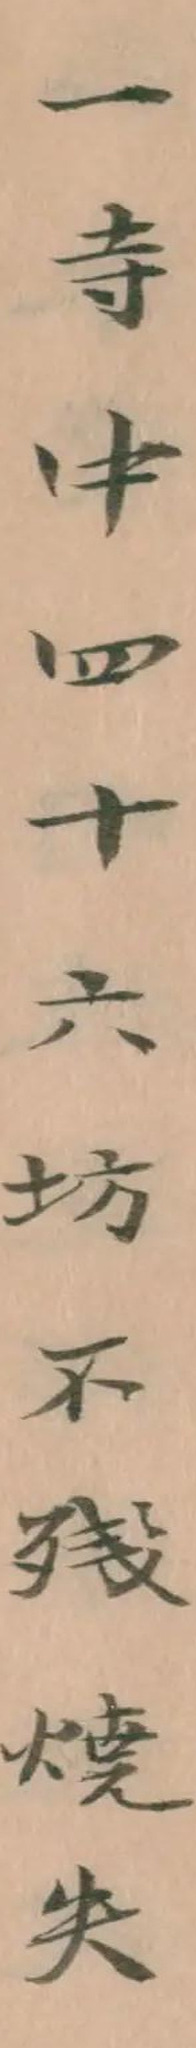一寺中四十六坊不残焼失
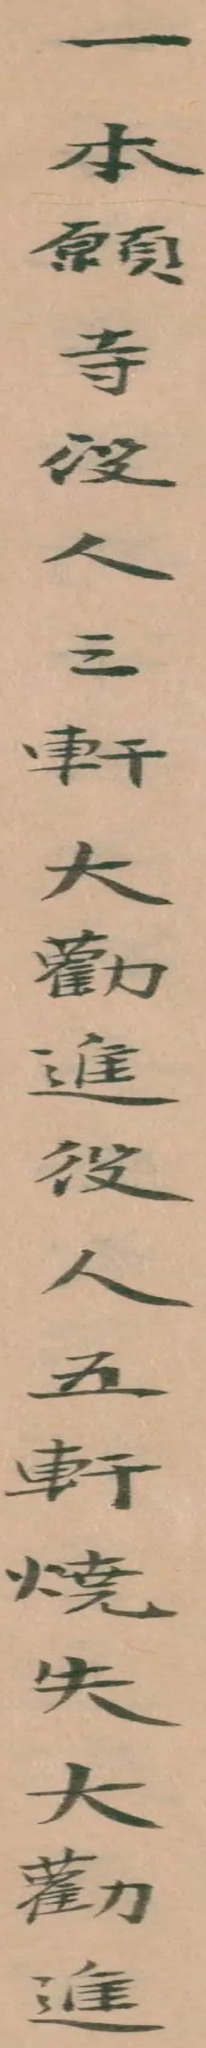一本願寺役人三軒大勧進役人五軒焼失大勧進
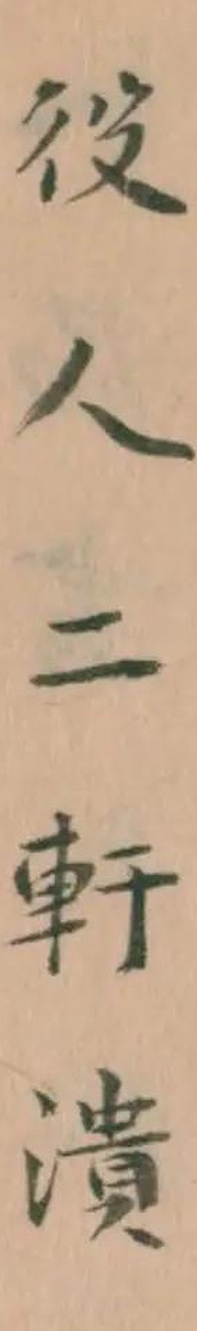役人二軒潰
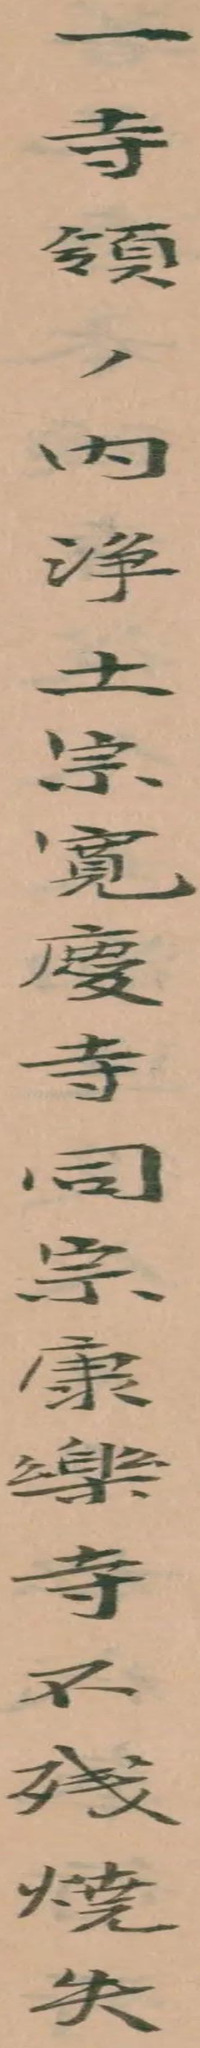一寺領ノ内浄土宗寛慶寺同宗康楽寺不残焼失
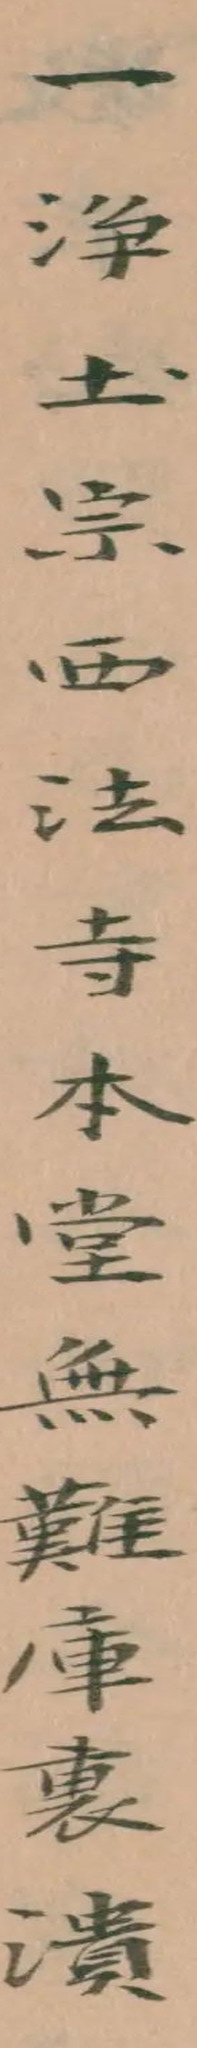一浄土宗西法寺本堂無難庫裏潰
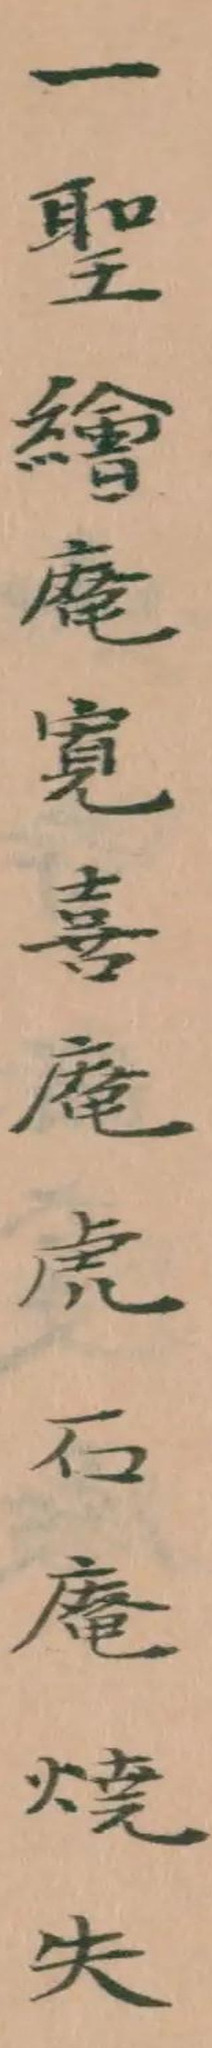一聖絵庵寛喜庵虎石庵焼失
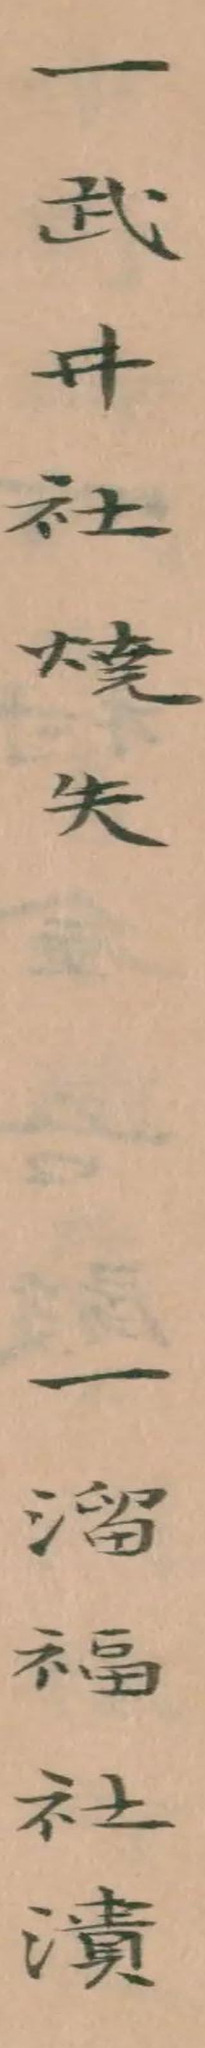一武井社焼失一溜福社潰
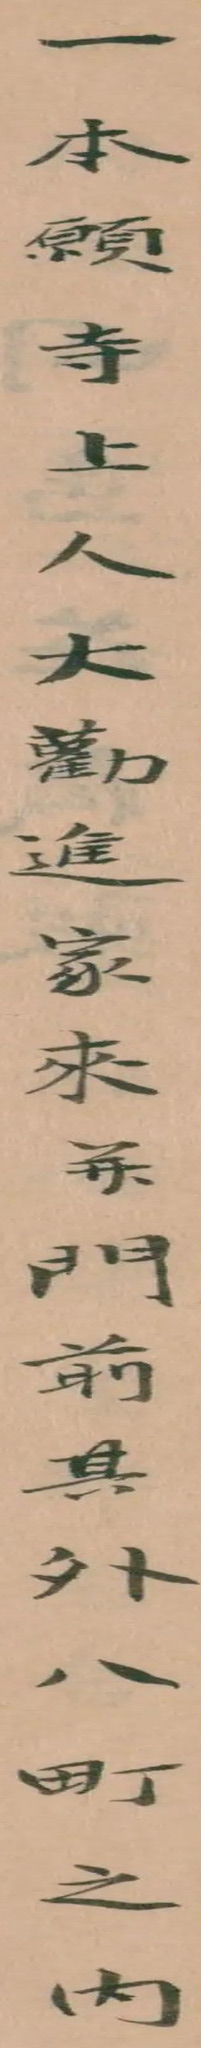一本願寺上人大勧進家来并門前其外八町之内
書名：地災撮要. 巻5-6(地震之部)
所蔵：国立国会図書館 National Diet Library, JAPAN
